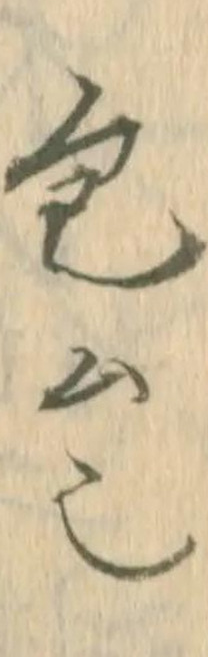包ム也
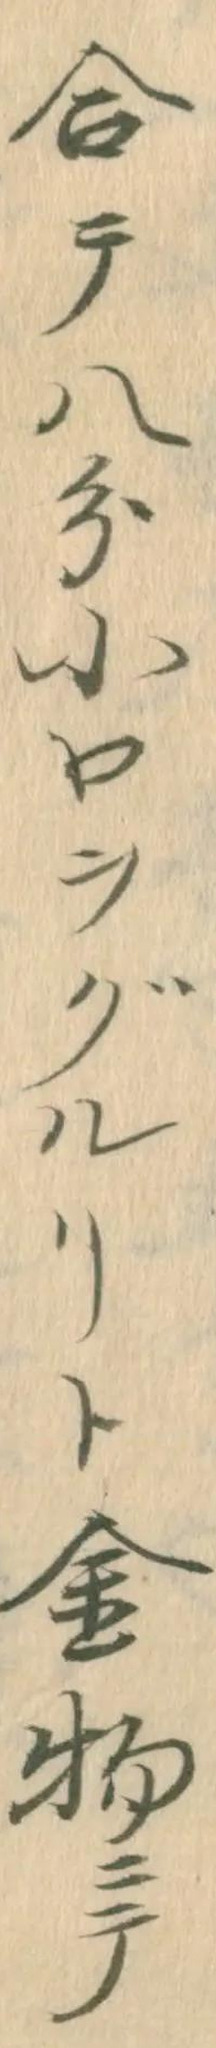合テ八分小口ヲグルリト金物ニテ
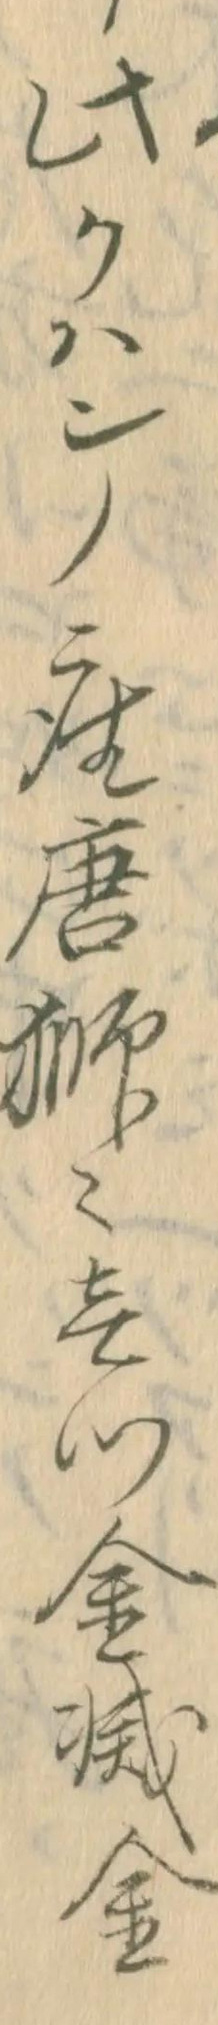此クハンノ座唐獅々壱ツ金滅金
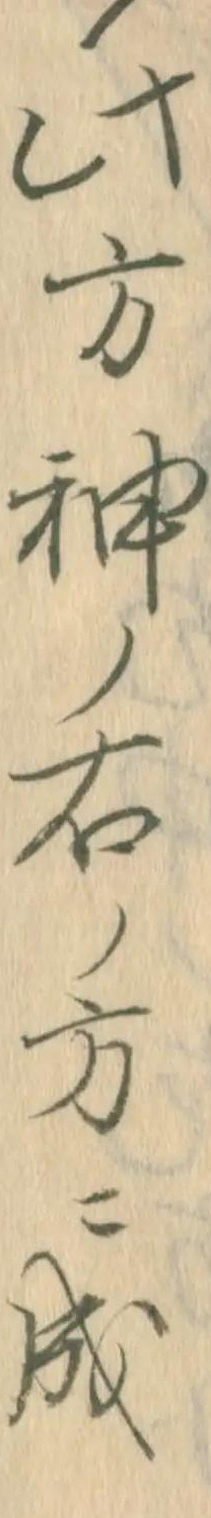此方神ノ右ノ方ニ成

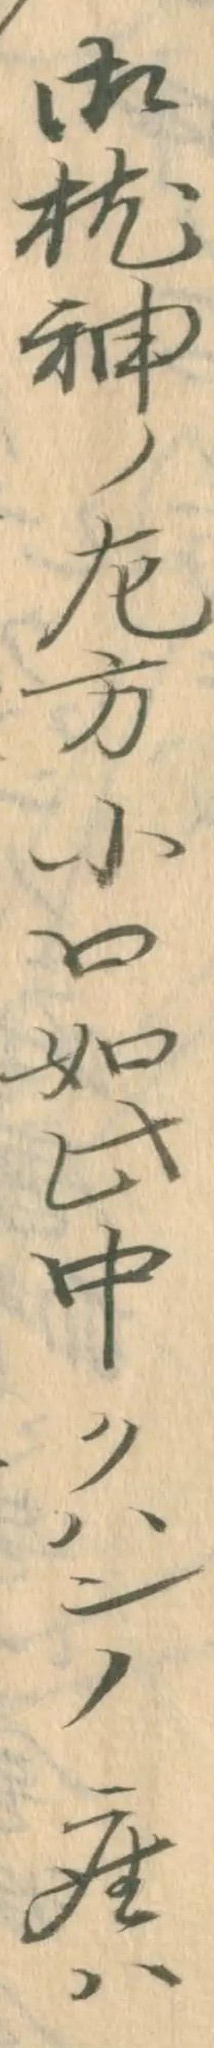御枕神ノ左方小口如此中クハンノ座ハ
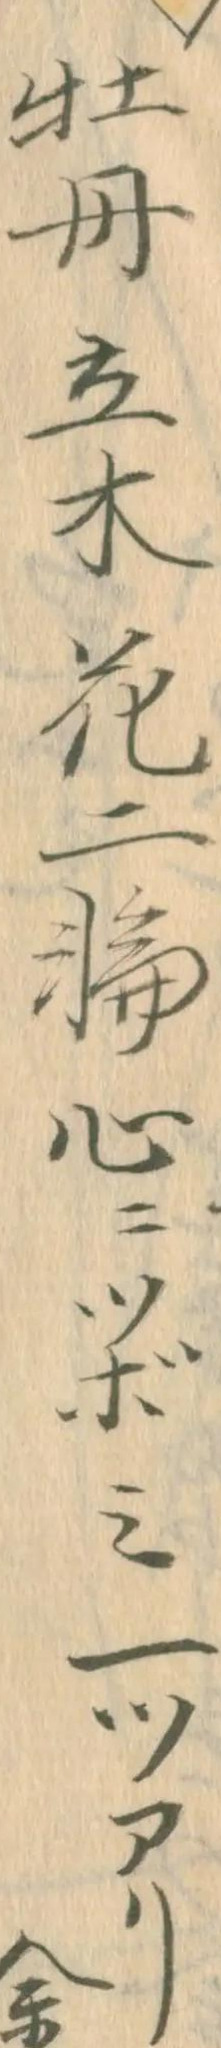牡丹立木花二輪心ニツボミ一ツアリ
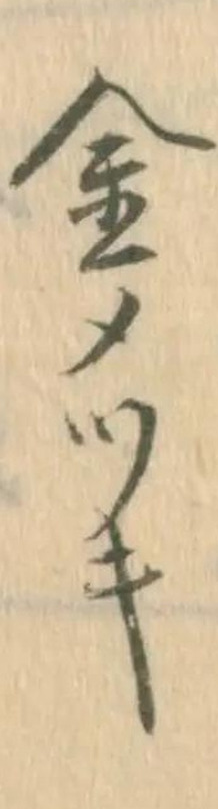金メツキ
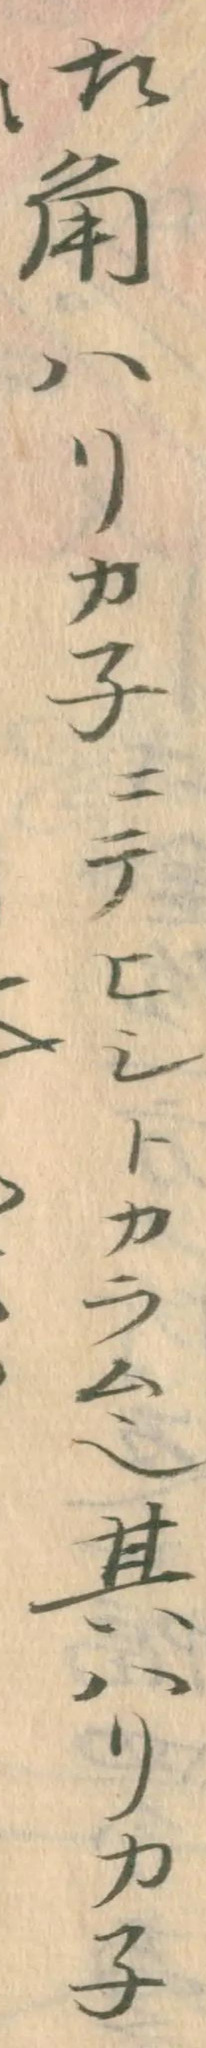御角ハリカネニテヒシトカラム也其ハリカネ
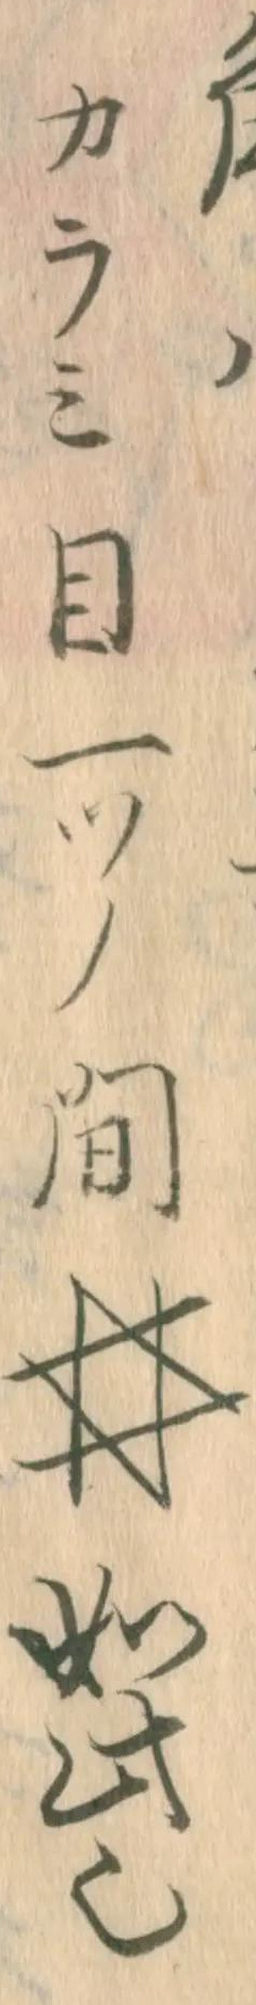カラミ目一ツノ間如此也
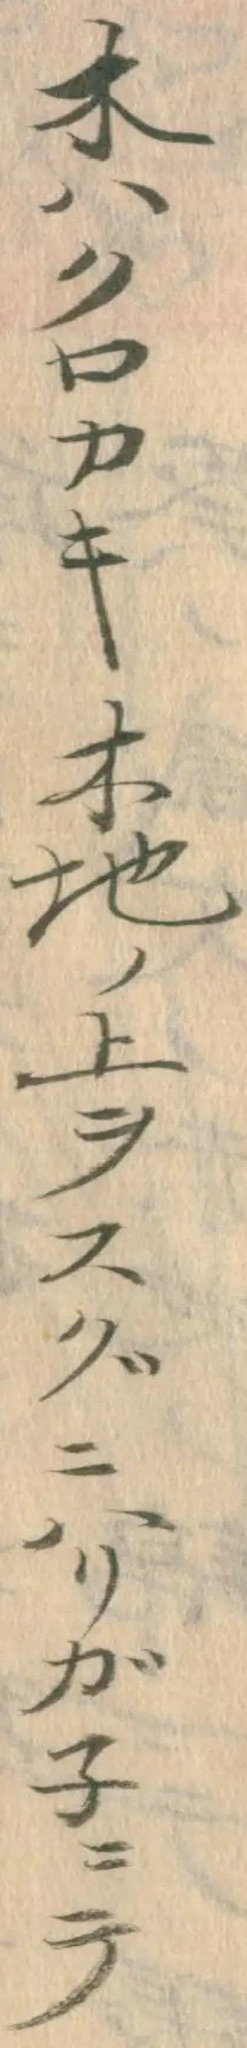木ハクロカキ木地ノ上ヲスグニハリガネニテ
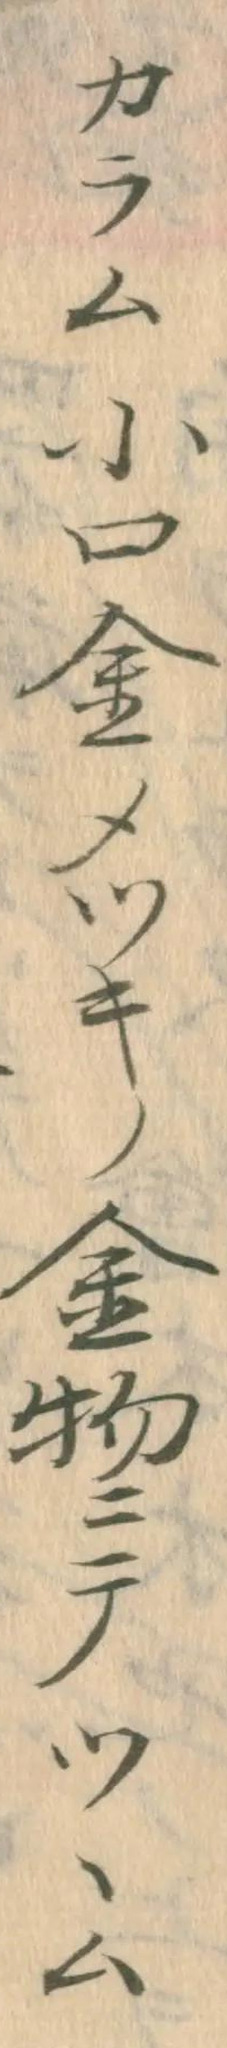カラム小口金メツキノ金物ニテツヽム
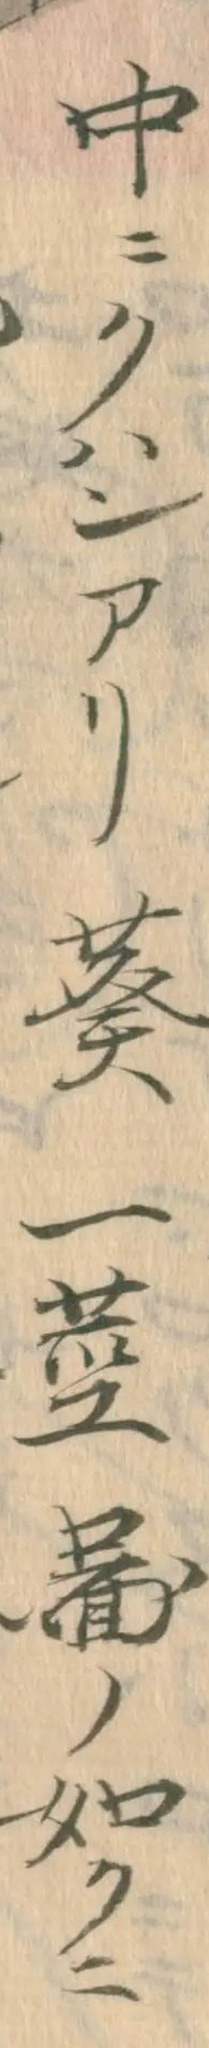中ニクハンアリ葵一茎図ノ如クニ
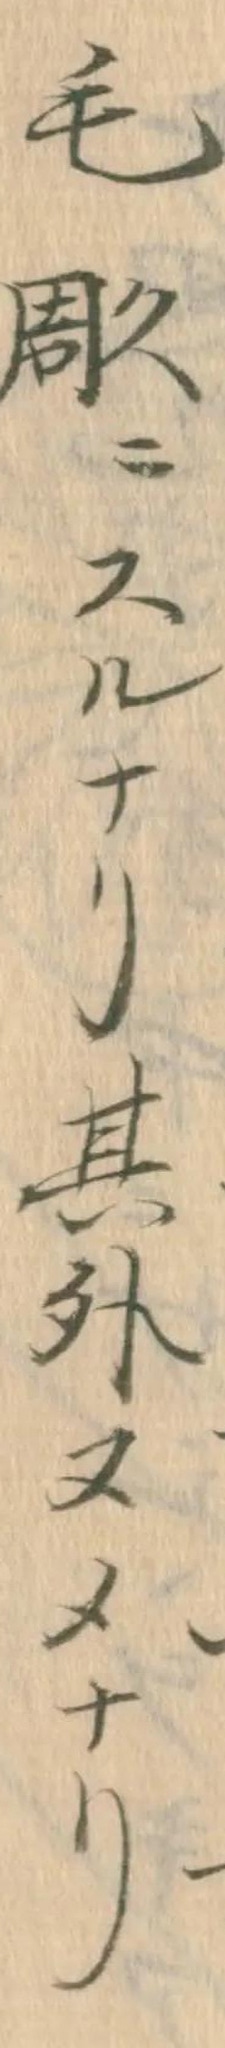毛彫ニスルナリ其外ヌメナリ
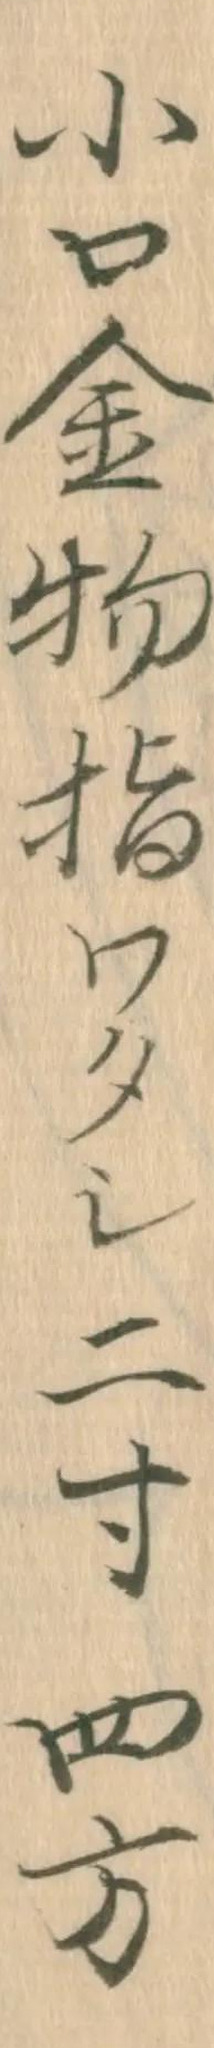小口金物指ワタシ二寸四方
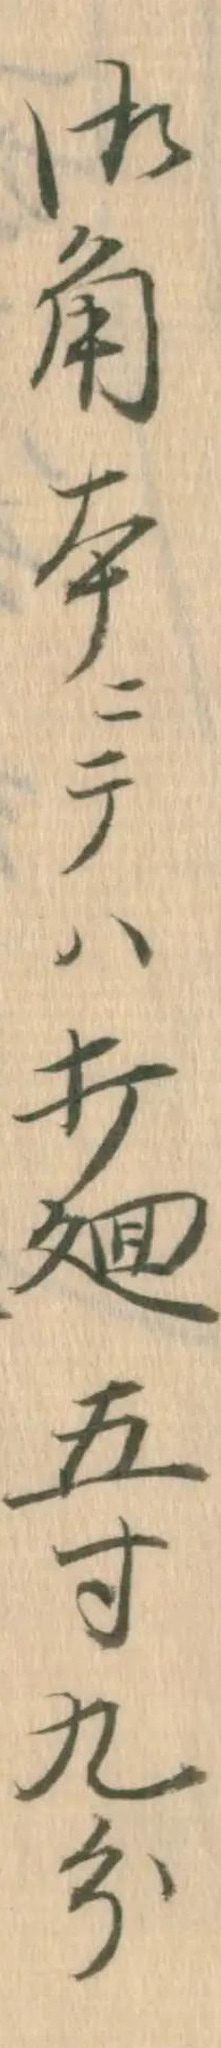御角本ニテハ打廻五寸九分
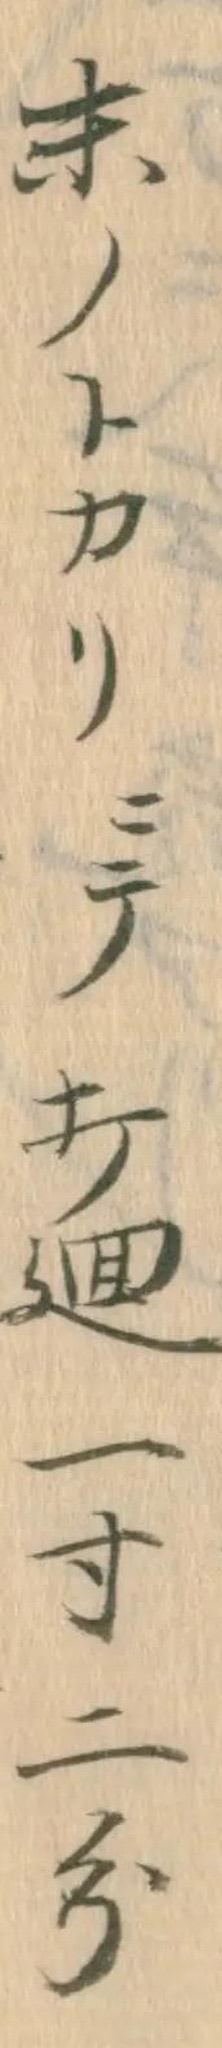末ノトカリニテ打廻一寸二分
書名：賀茂社記録. 第15冊
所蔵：国立国会図書館 National Diet Library, JAPAN
